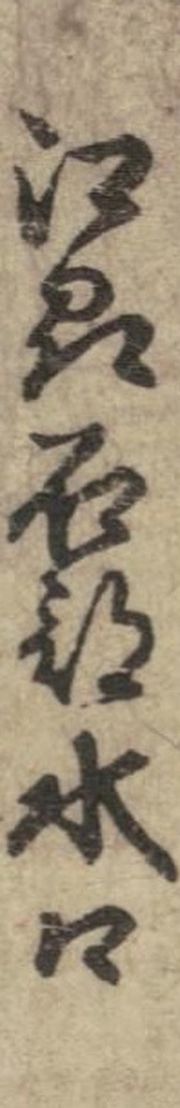江州石部水口
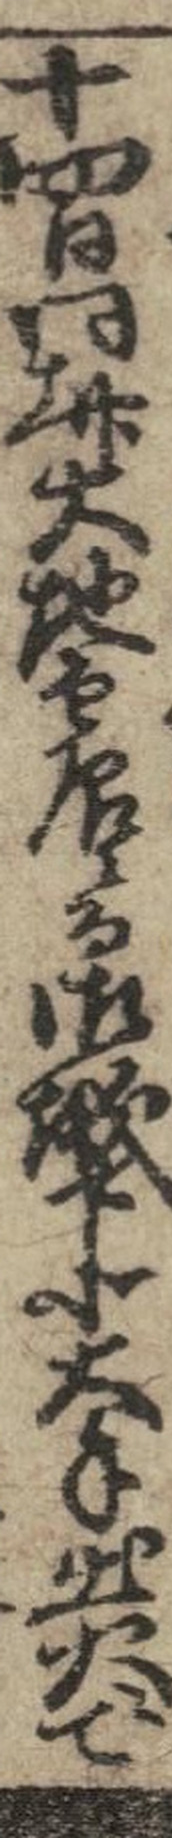十四日同刻大地震にて御城下北大手出火にて
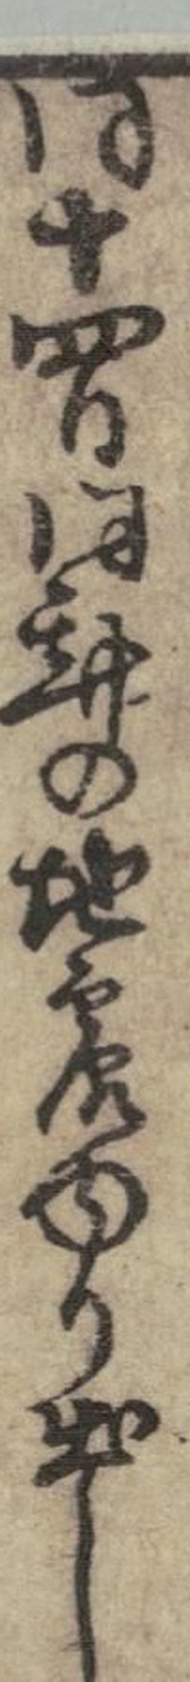同十四日同刻の地震ゆり出し
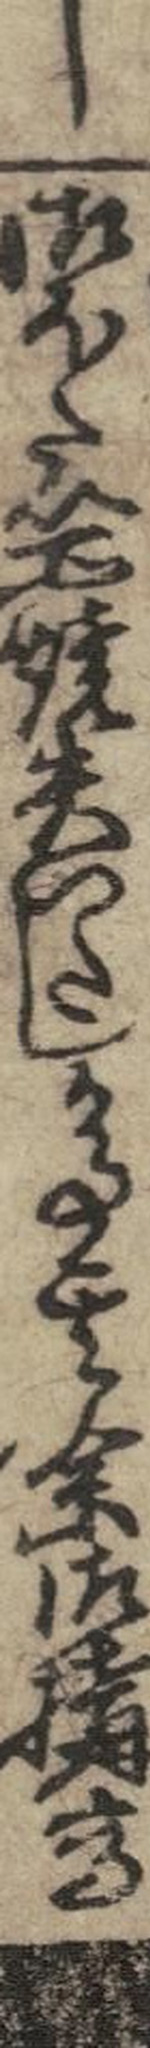御ほた処工焼失いたし事其余御構髙
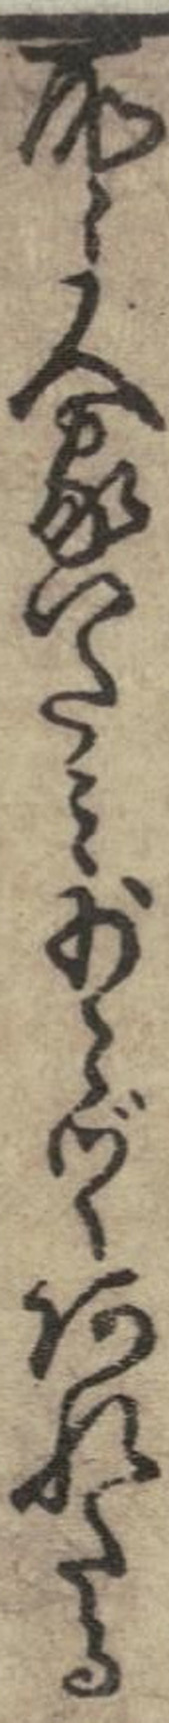所〻人家いたみ少〻ヅゝあれたる
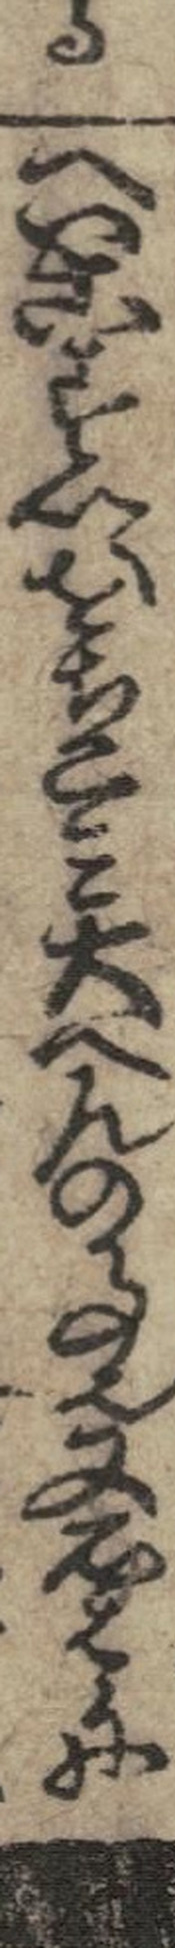へいこす処おちこみ大へんの事也又石はうみ
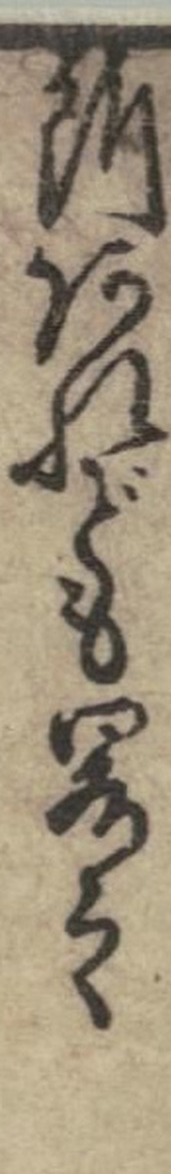所あれども崩す
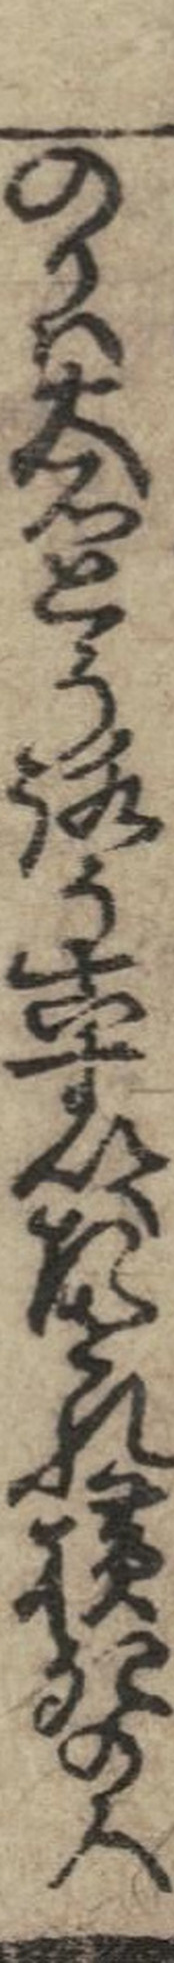のりは大石とう路うこす処たをれ横死の人
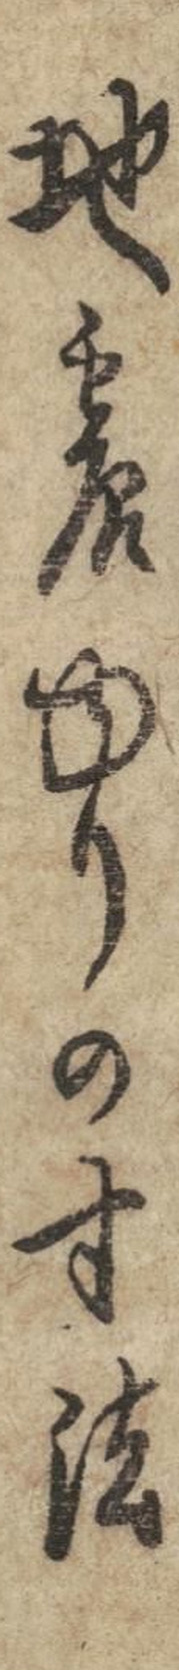地震ゆりの寸法
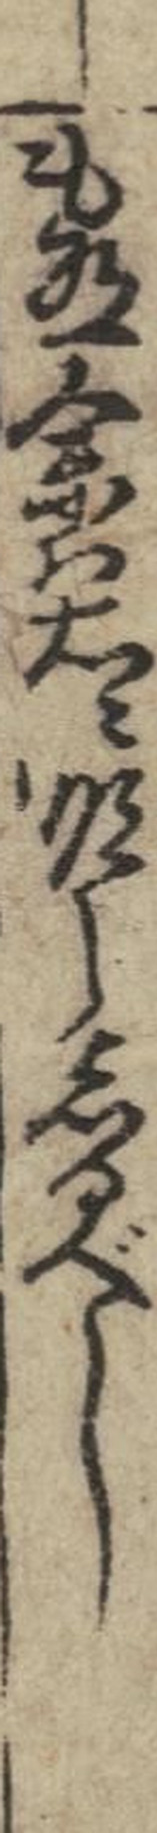も有余は右に順ししるべし
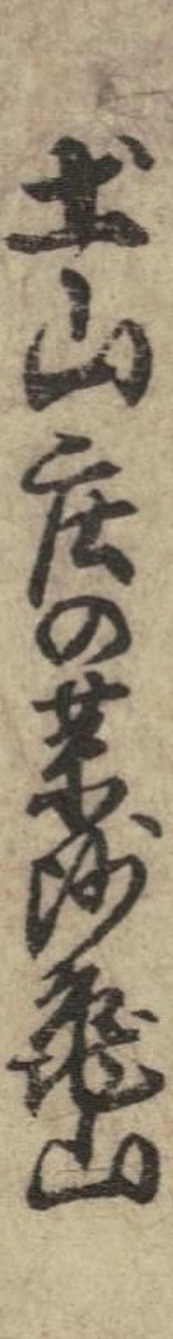土山庄の茉沙亀山
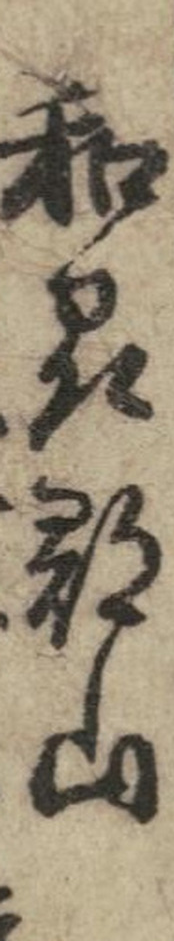和州郡山
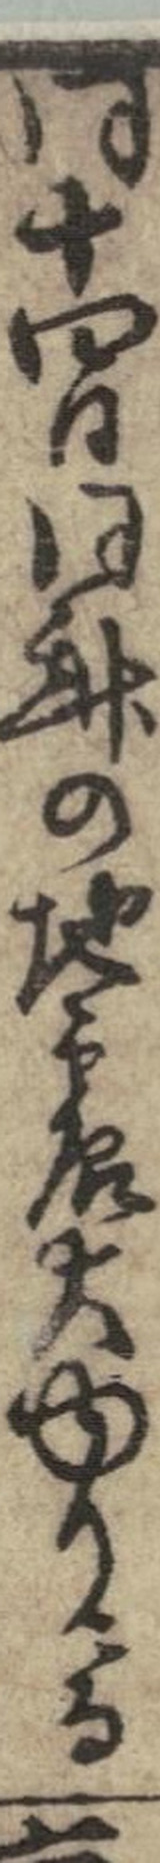同十四日同刻の地震大ゆりにて
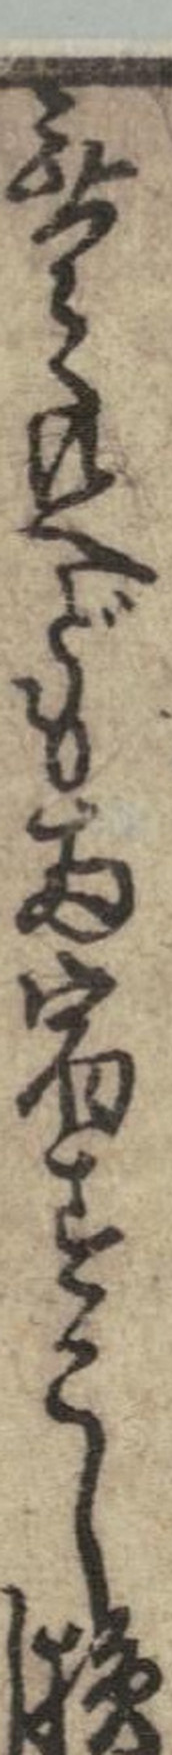暫といへども両宿すこし損じ
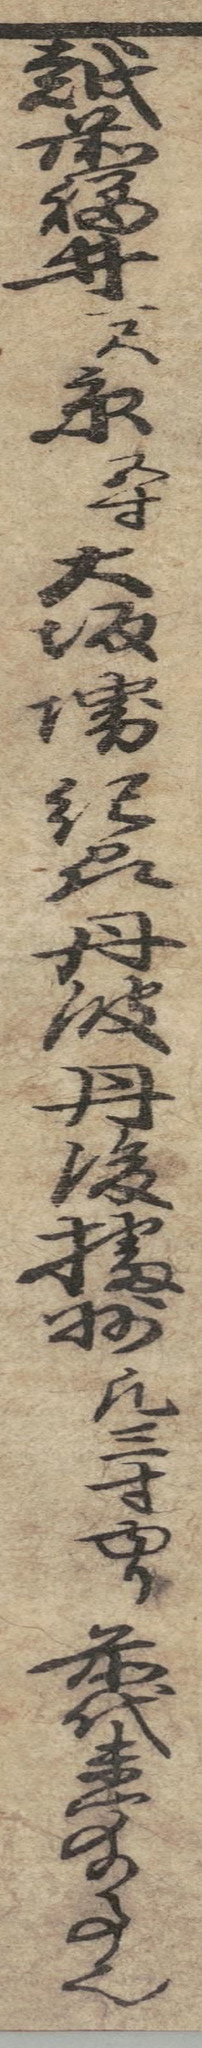越前福井一尺京五寸大坂堺紀州丹波丹後播州凡三寸ゆり前代未聞の事也
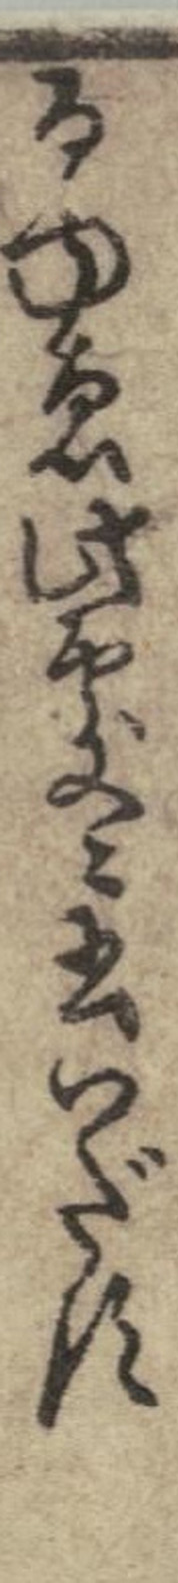るゆゑ此処に書いだす
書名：聞書　諸國大地震并ニ出火・早飛脚廻りにてくわしき所本しらべ　大地震・山城勢州大和三河江州越前　聞書　大地震並ニ出火の次第
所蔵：東京大学地震研究所図書室 Earthquake Research Institute Library, The University of Tokyo, JAPAN
